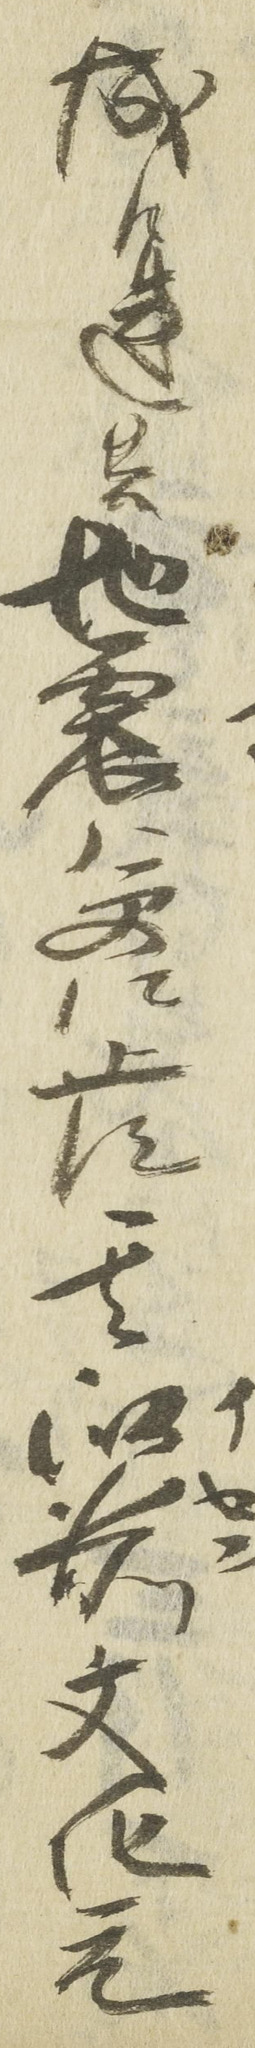成けれ共地震は更に止す其以前文化元
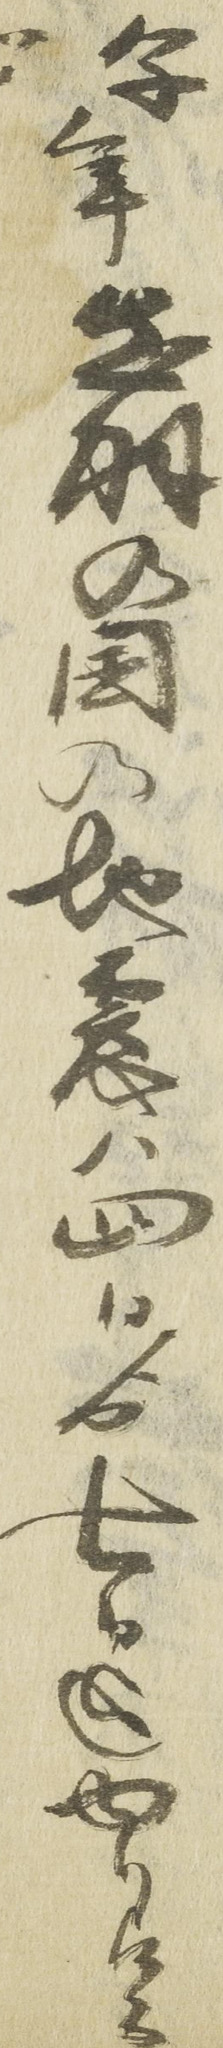子年出羽の国の地震は四日ゟ七日迄ゆりける
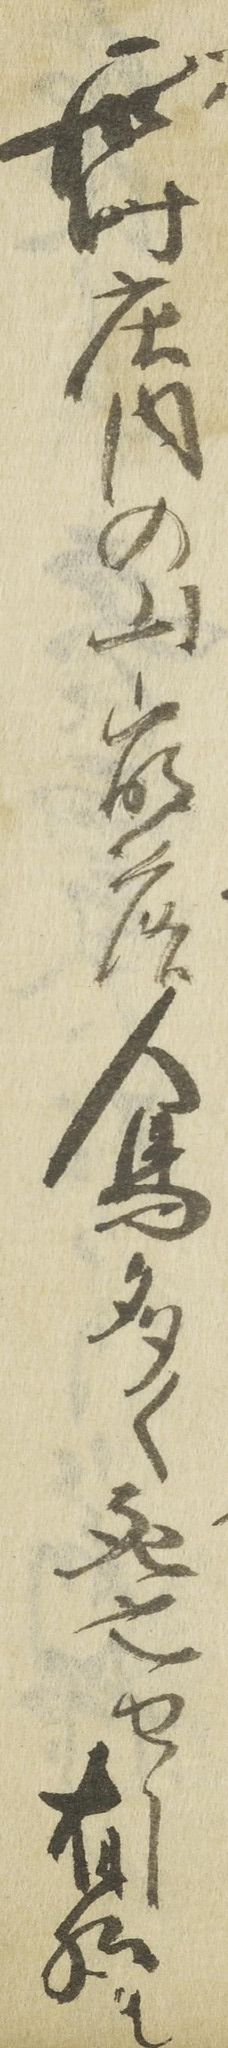此時庄内の山崩落人馬多く死亡せし有様も
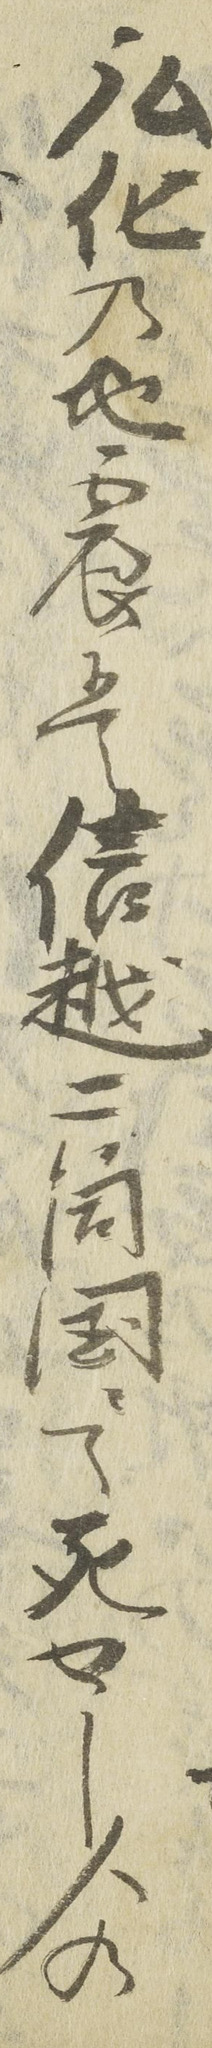弘化の地震にて信越に箇国ニて死せし人の
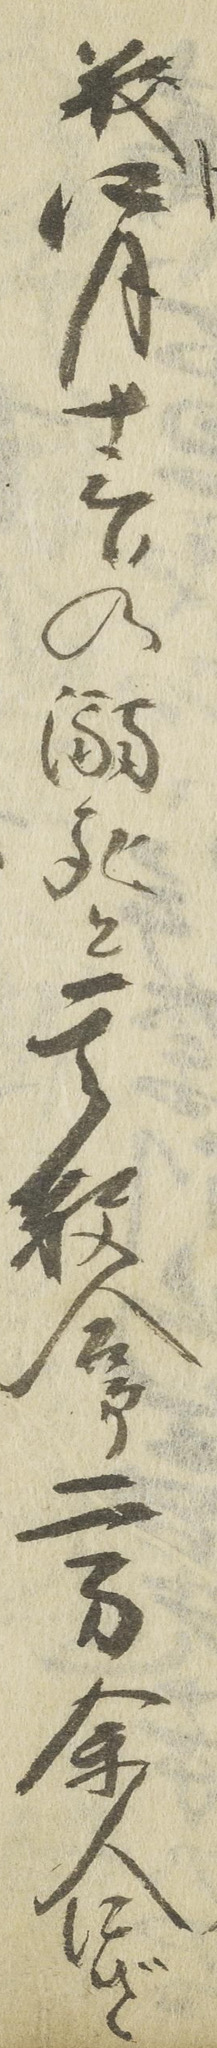数ト四月十三日の溺死と其数合て二万余人にぞ
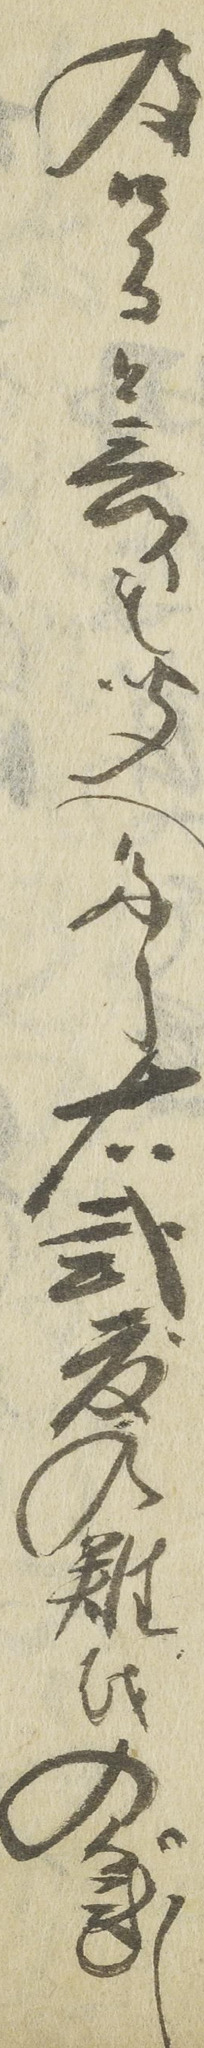及けると言いも聞へたり右弐度の難をのがれし
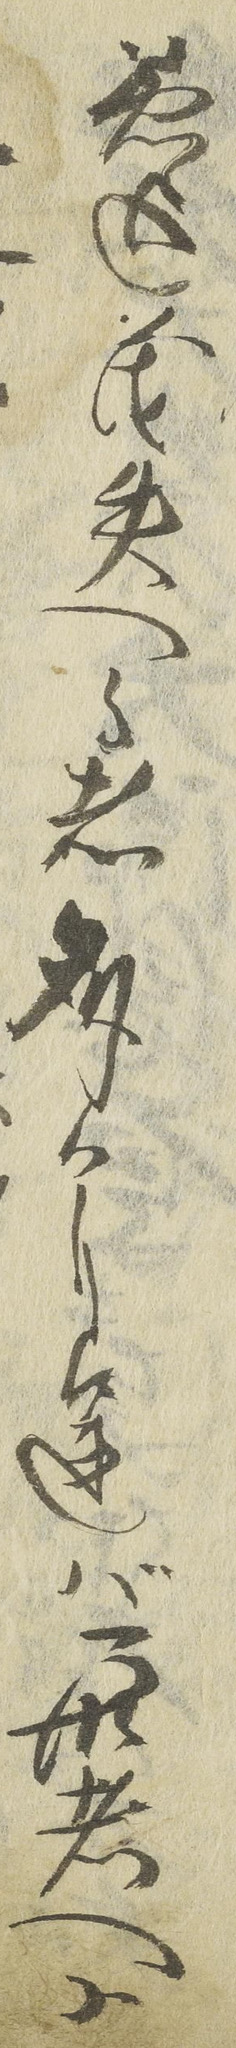具迄も失へる者多かりければ此者へは
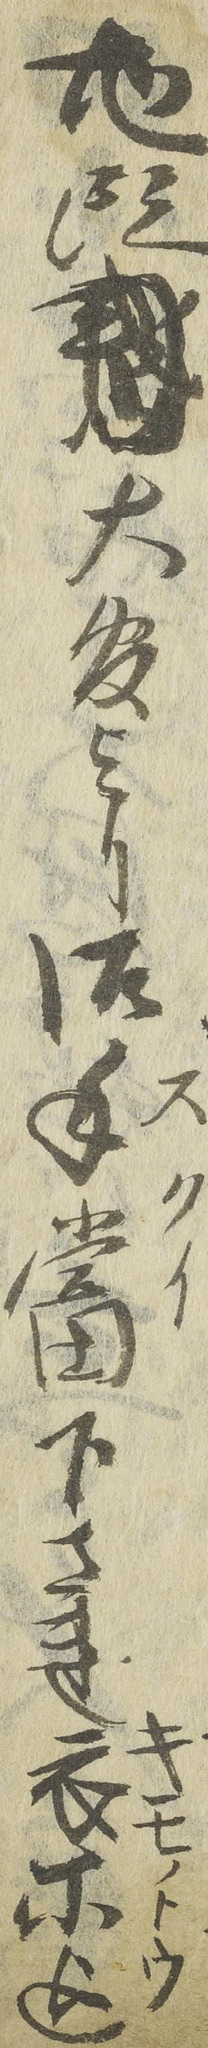地頭大官より御手当下され衣等迄
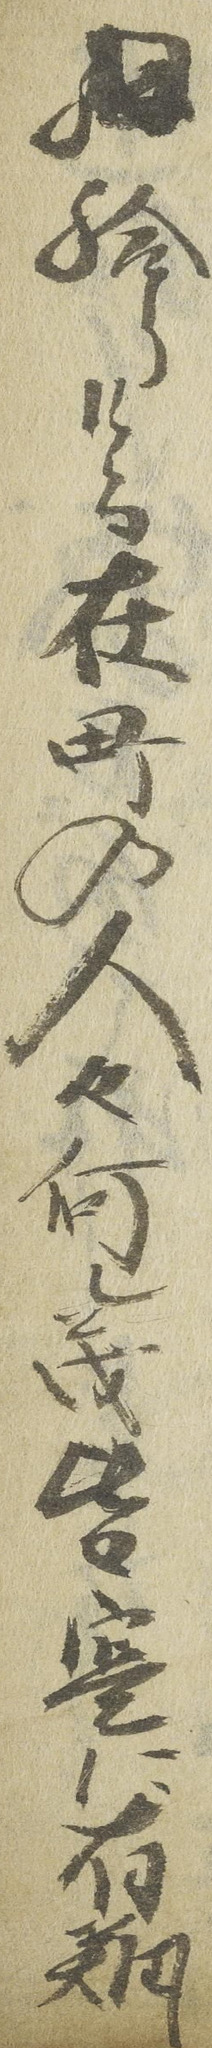給りける在町の人々何レも皆寔に有難

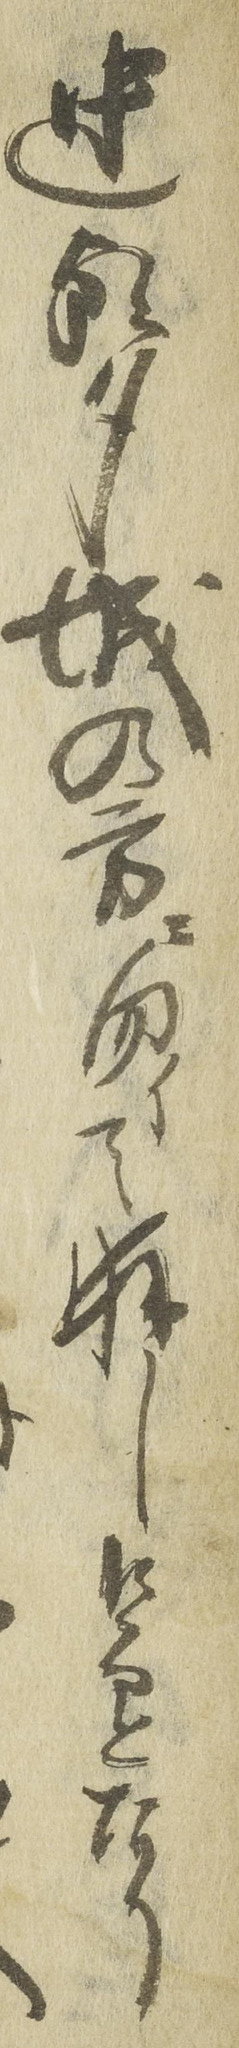迚朝夕城の方ニ向イて拝しけるとなり
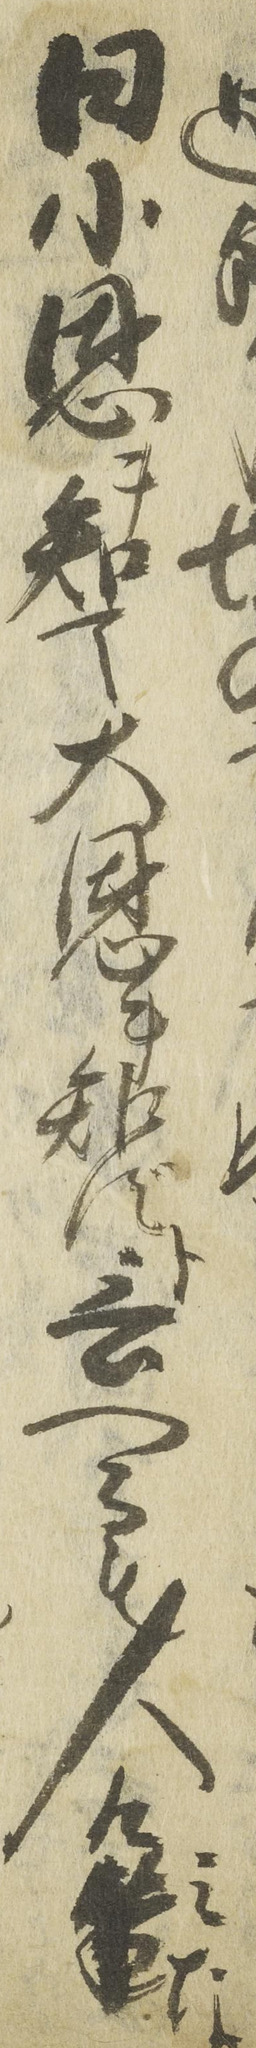曰小恩ヲ知て大恩ヲ知ずと言つるも人々皆
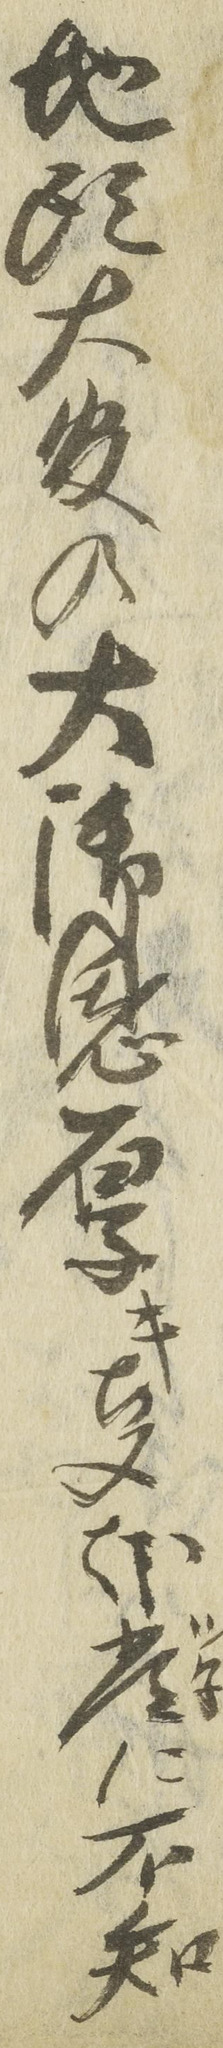地頭大官の大御恩厚き事を常に不知
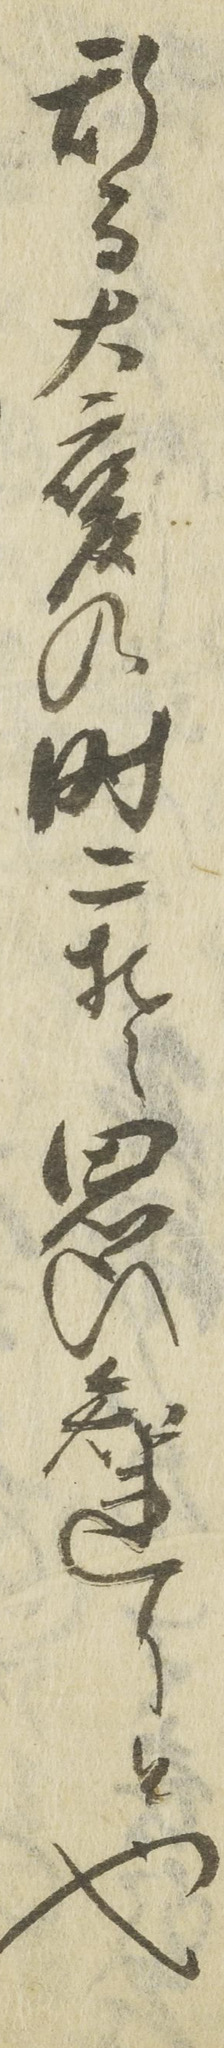欺る大変の時こそ思ひ知れりと也
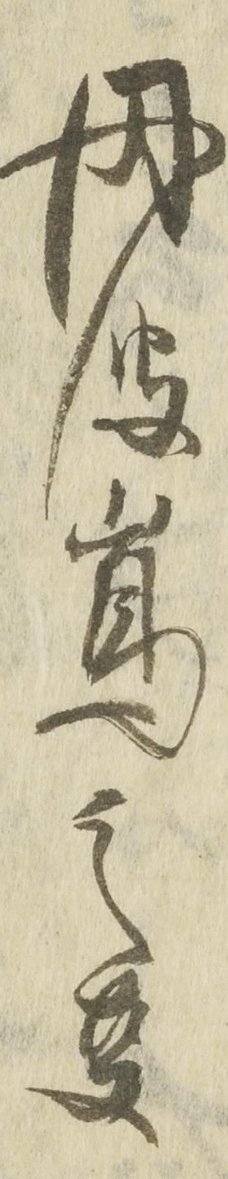丹波嶌之事
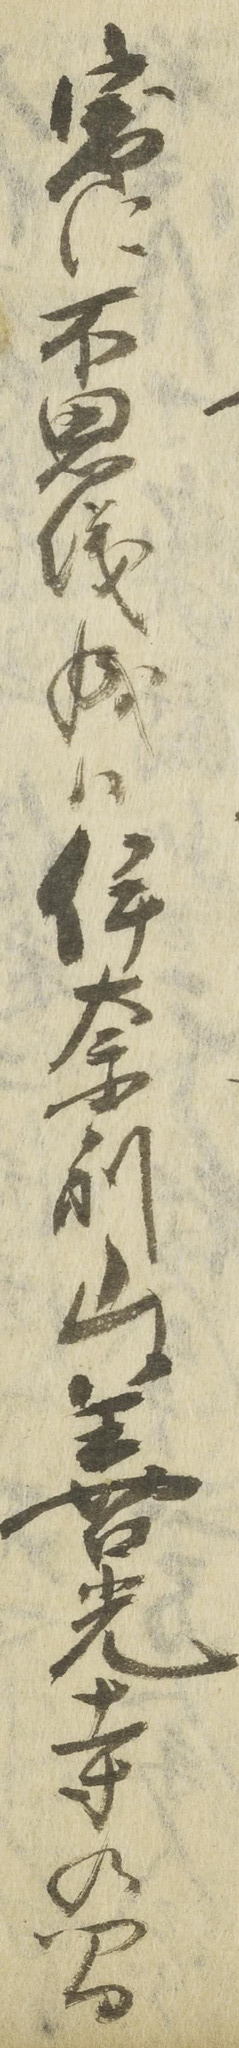常に不思議成は伊那利山善光寺の間
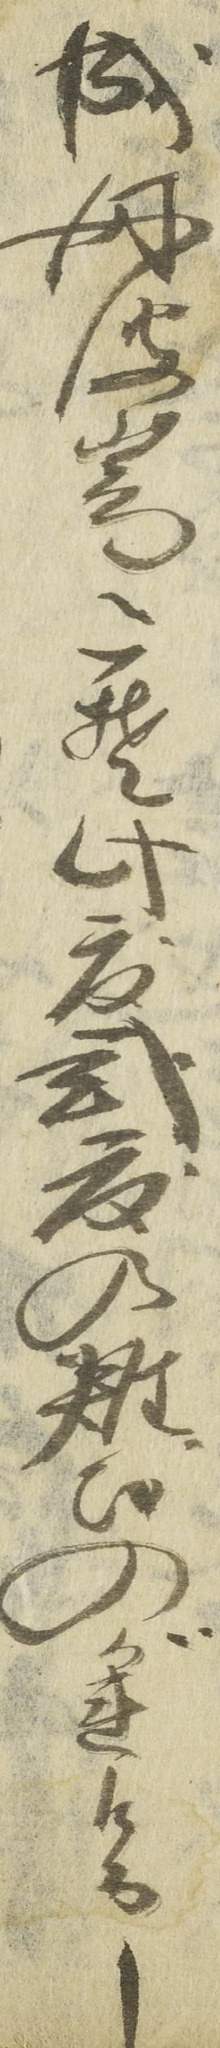成丹波嶌こそ此度弐度の難をのがれける
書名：善光寺地震聞書
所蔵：東京大学地震研究所図書室 Earthquake Research Institute Library, The University of Tokyo, JAPAN
